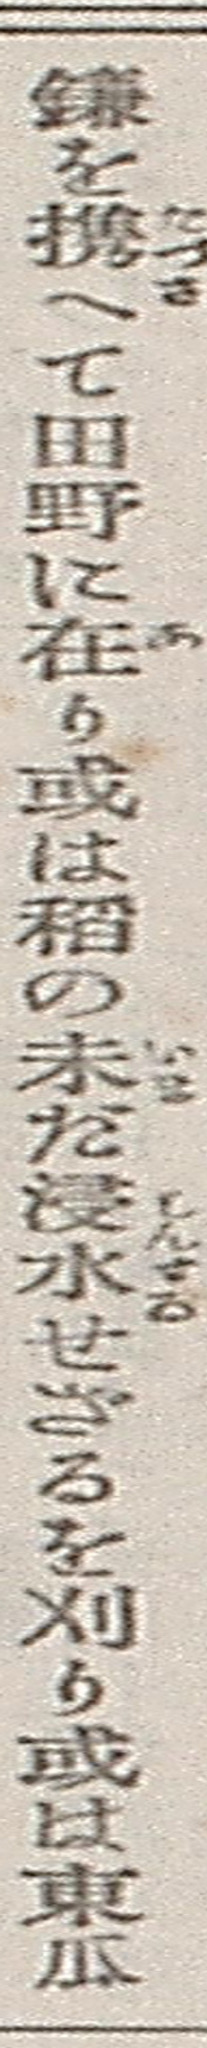鎌を携へて田野に在り或は稲の未だ浸水せざるを刈り或は東瓜
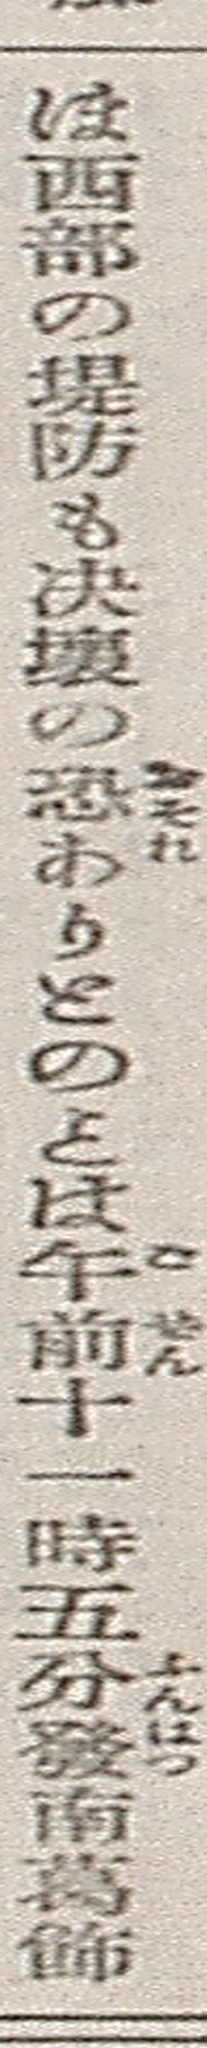ほ西部の堤防も決壊の恐ありとのことは午前十一時五分発南葛飾
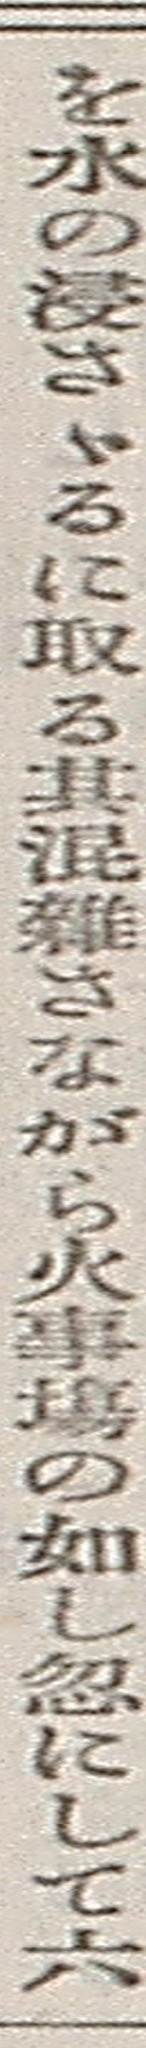を水の浸さゞるに取る其混雑さながら火事場の如し忽にして六
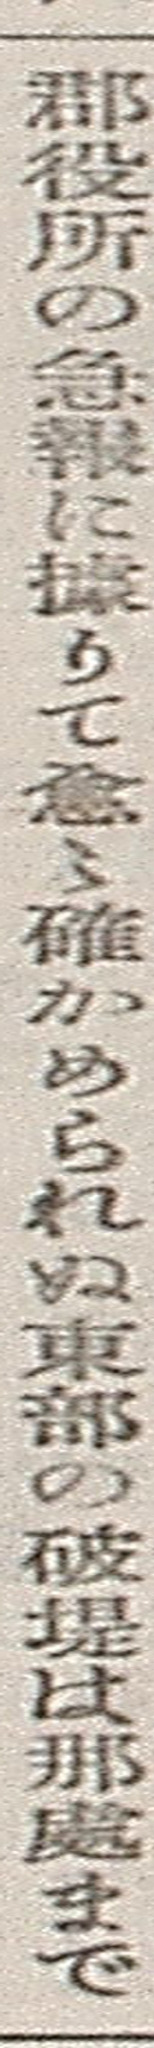郡役所の急報に拠りて愈々確かめられぬ東部の破堤は那処まで
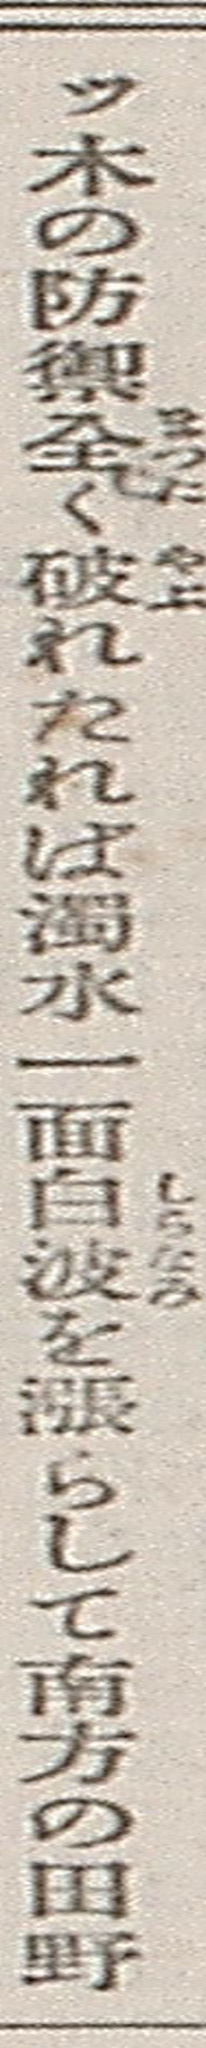ツ木の防禦全く破れたれば濁水一面白波を漲らして南方の田野
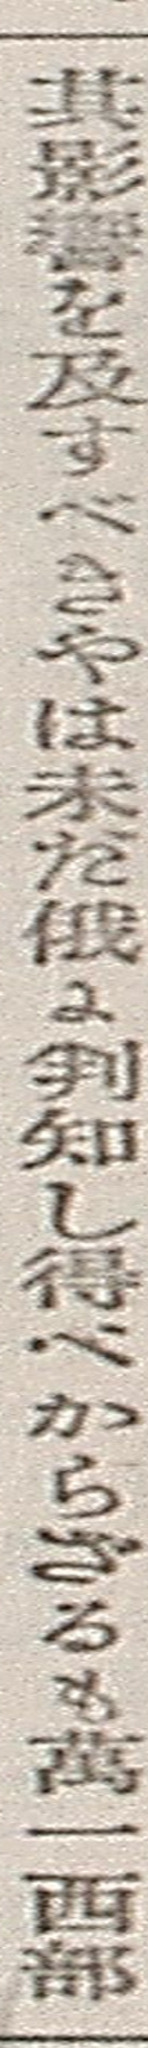其影響を及すべきやは未だ俄に判知し得べからざるも万一西部
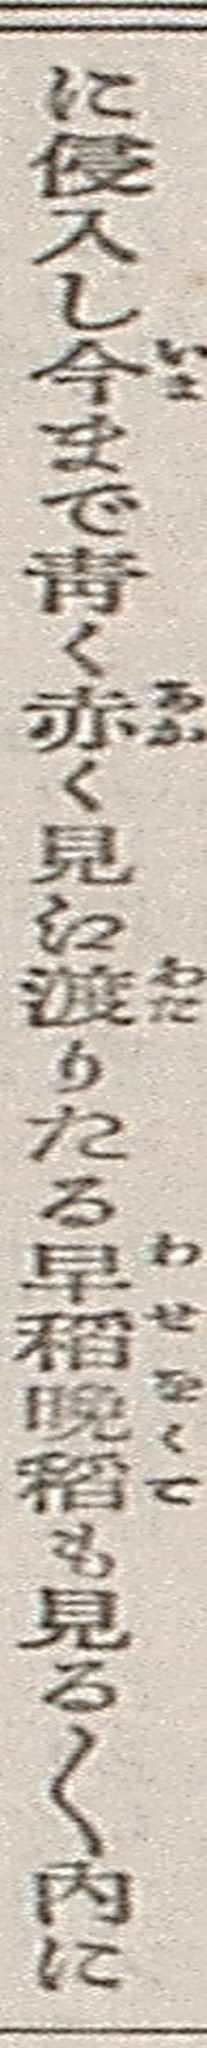に浸水し今まで青く赤く見え渡りたる早稲晩稲も見る〳〵内に
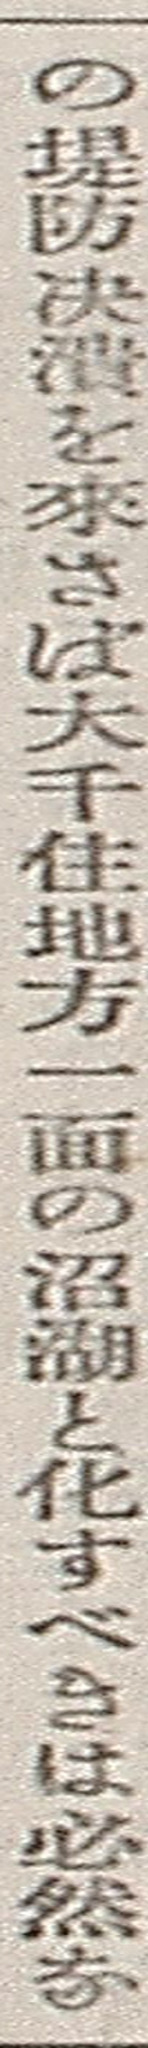の堤防決潰を来さば大千住地方一面の沼湖と化すべきは必然な
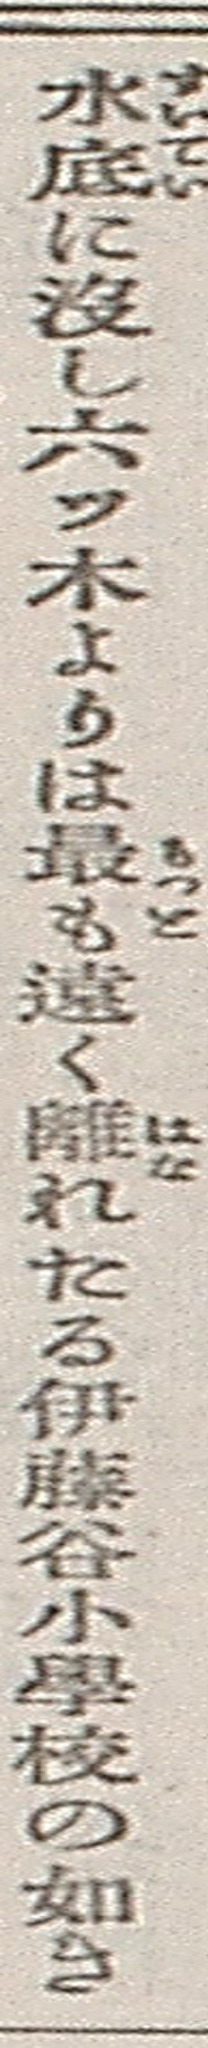水底に没し六ツ木よりは最も遠く離れたる伊藤谷小学校の如き
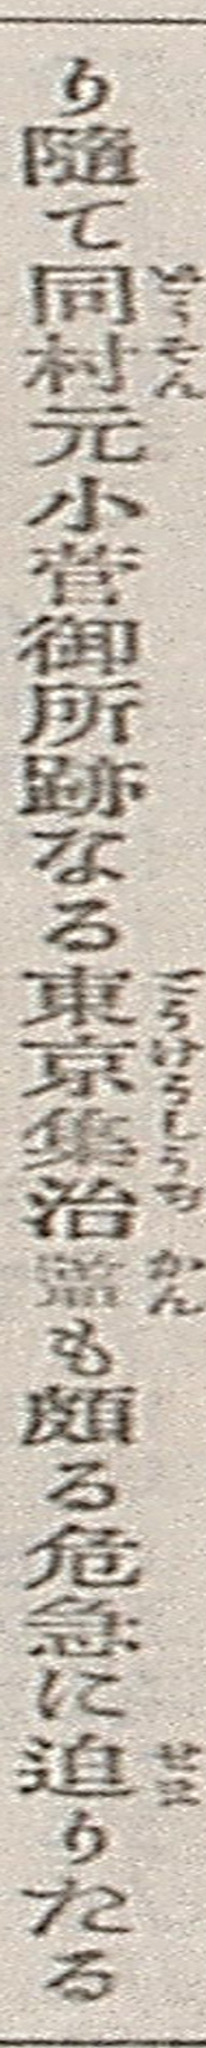り随て同村元小菅御所跡なる東京集治監も頗る危急に迫りたる
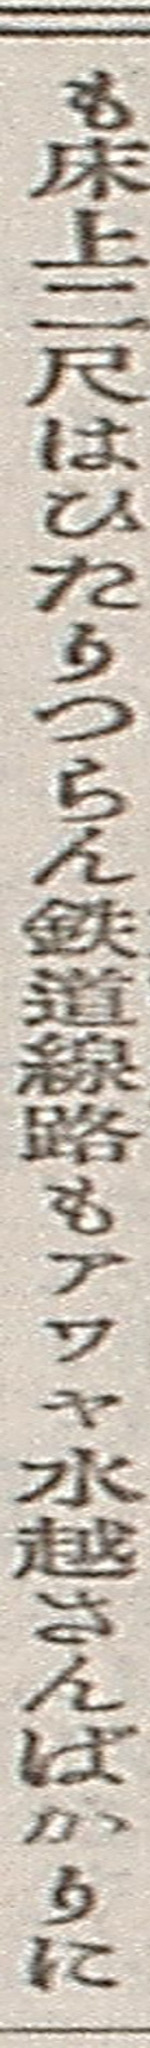も床上二尺はひたりつらん鉄道線路もアワヤ水越さんばかりに
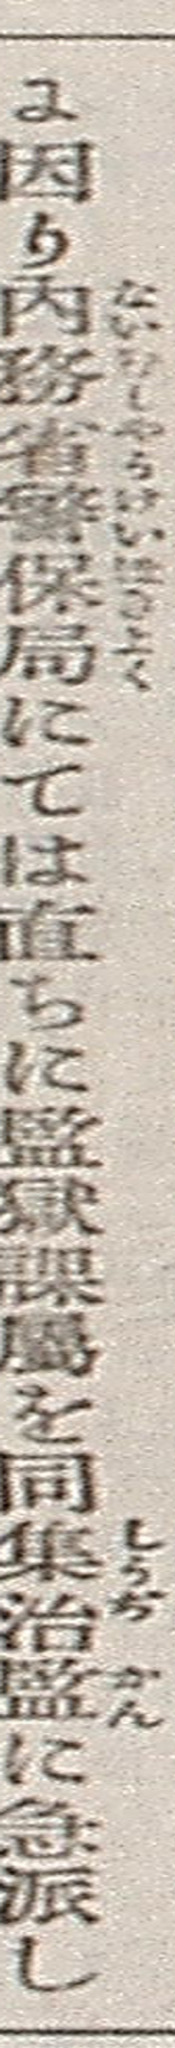に因り内務省警保局にては直ちに監獄課属を同集治監に急派し
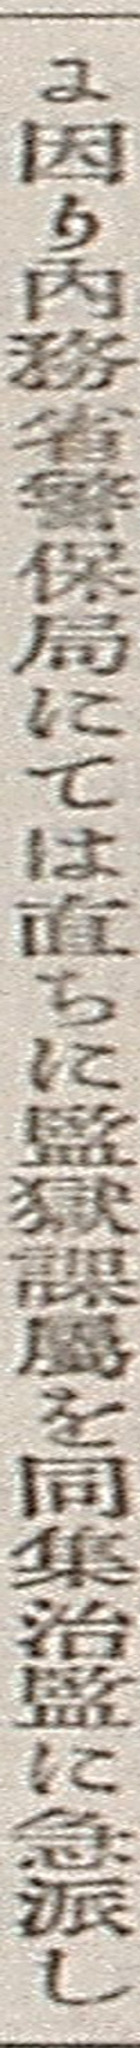に因り内務省警保局にては直ちに監獄課属を同集治監に急派し
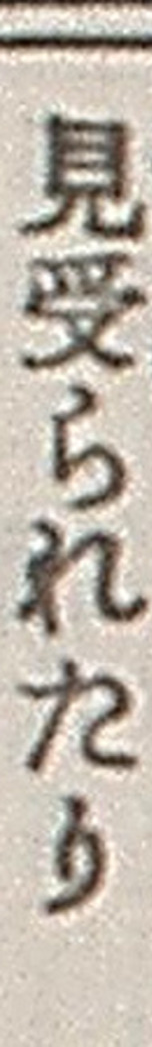見受られたり
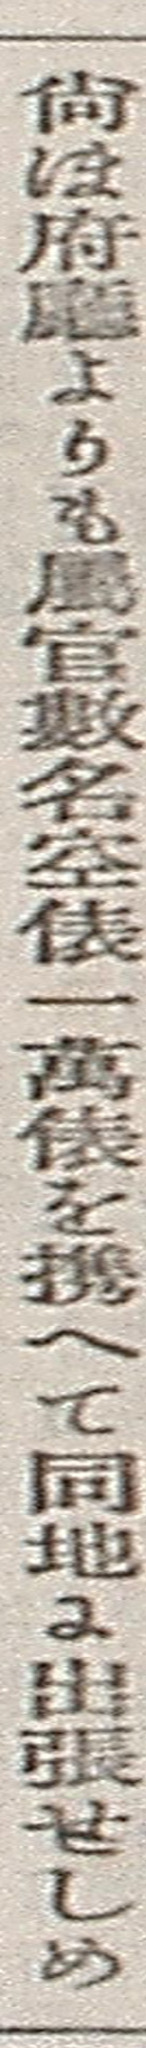尚ほ府庁よりも属官数名空俵一万俵を携へて同地に出張せしめ
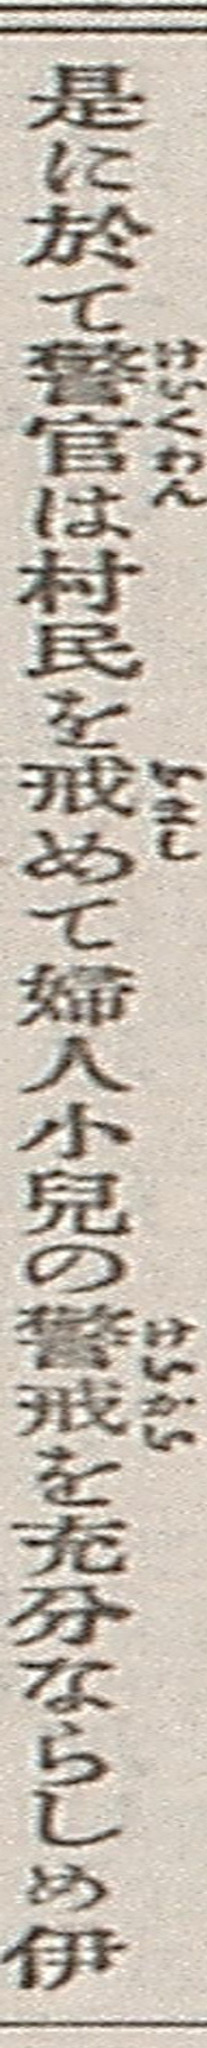是に於て警官は村民を戒めて婦人小児の警戒を充分ならしめ伊
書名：風俗畫報臨時増刊第百二十四號　洪水地震被害録（上）
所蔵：東京大学地震研究所図書室 Earthquake Research Institute Library, The University of Tokyo, JAPAN
